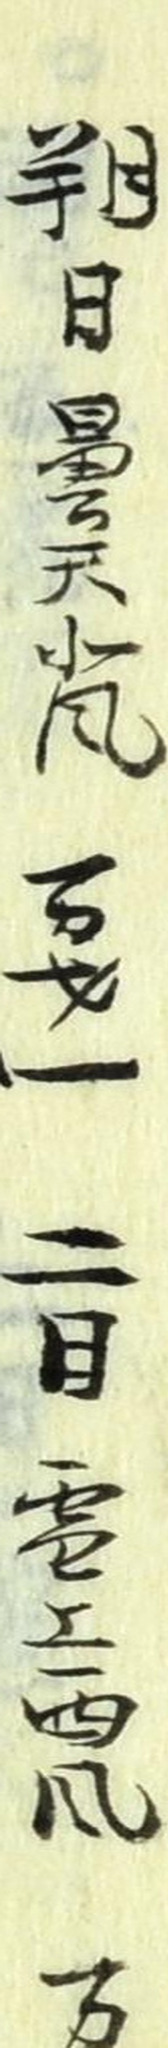朔日曇天北風万才一二日雪上西風万才一
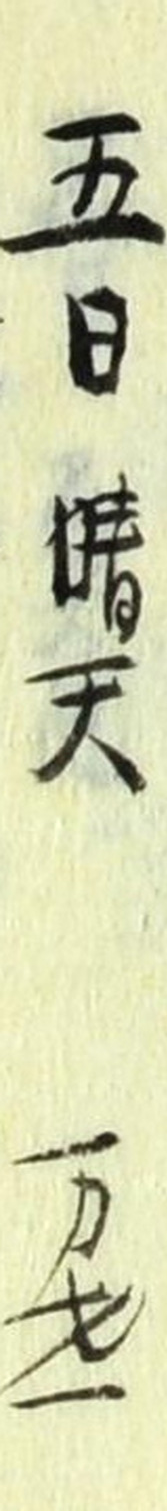五日晴天万才一
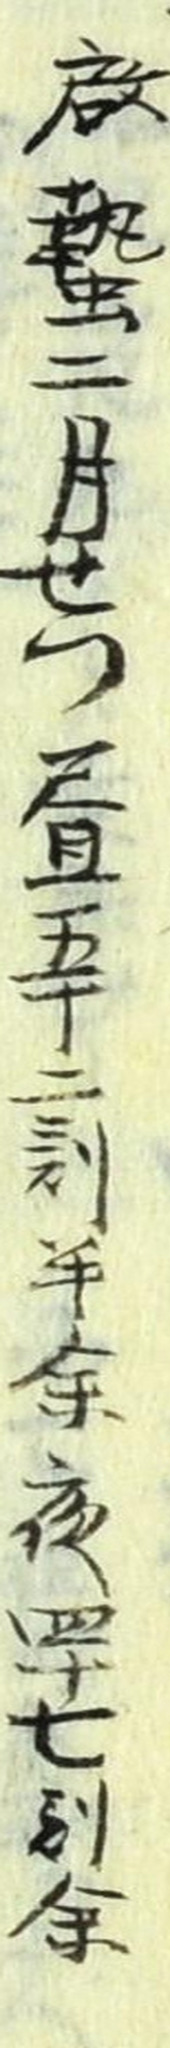啓蟄二月せつ昼五十二刻半余夜四十七刻余
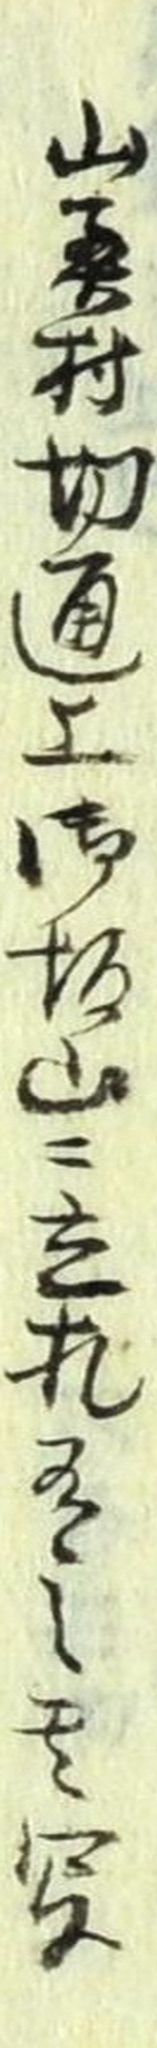山奥村切通上御坂山ニ立札有之其写
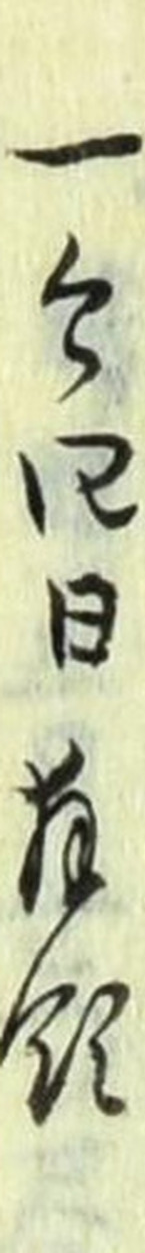一今四日拝領
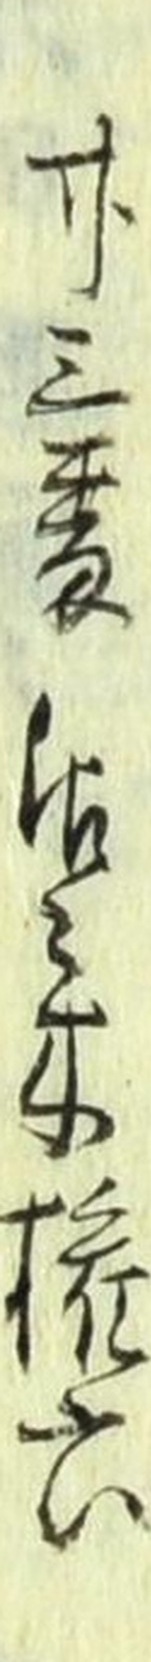廿三番佐々木権六
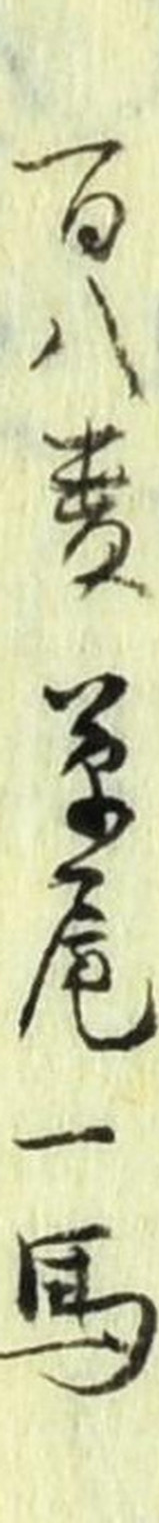百八番草尾一馬
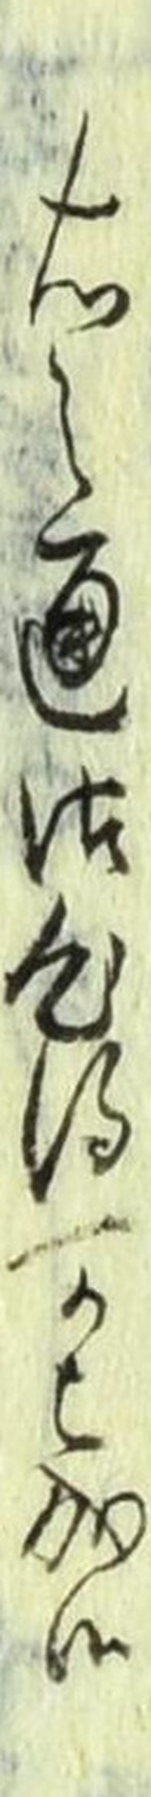右之通御心得可被成候
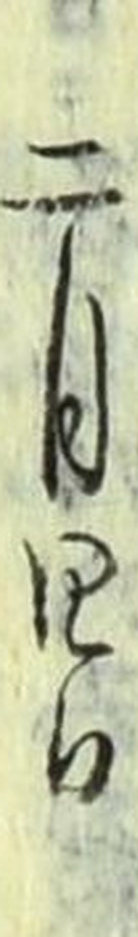二月四日
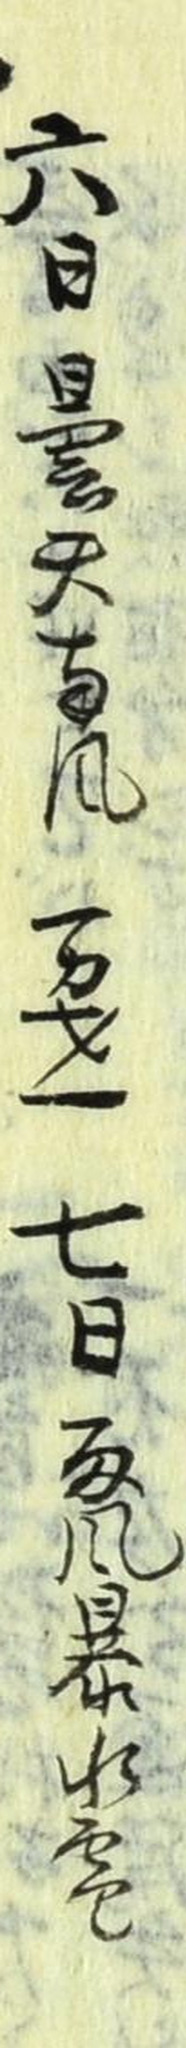●六日曇天南風万才一七日雨風暴水雪
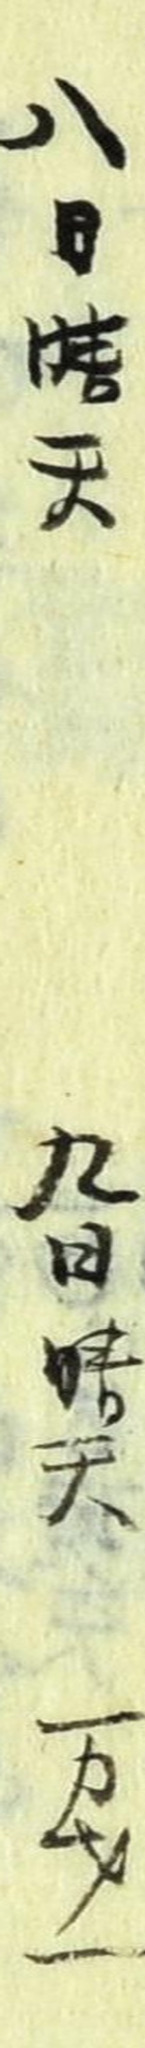八日晴天九日晴天万才一
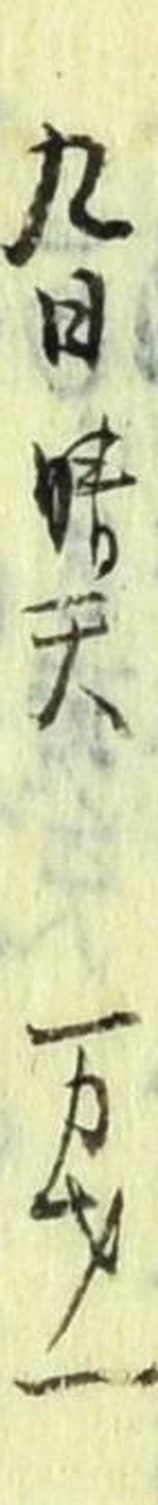五日晴天万才一
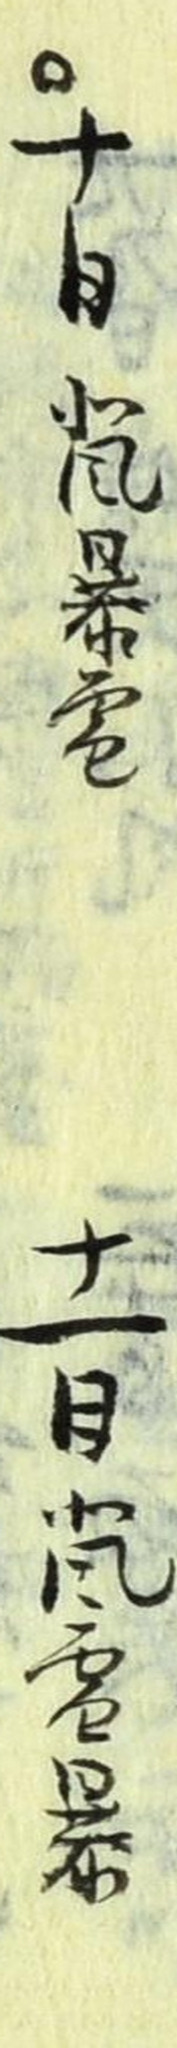○十日北風暴雪十一日北風雪暴
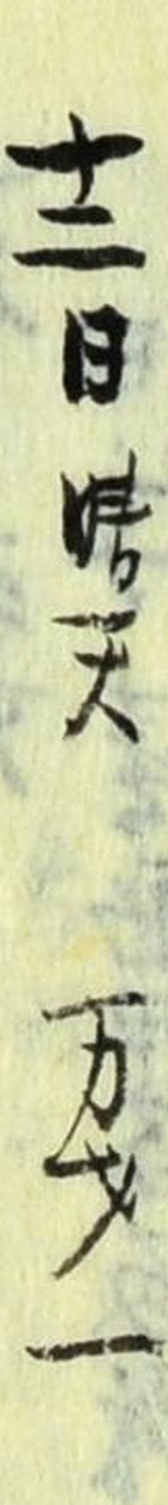五日晴天万才一
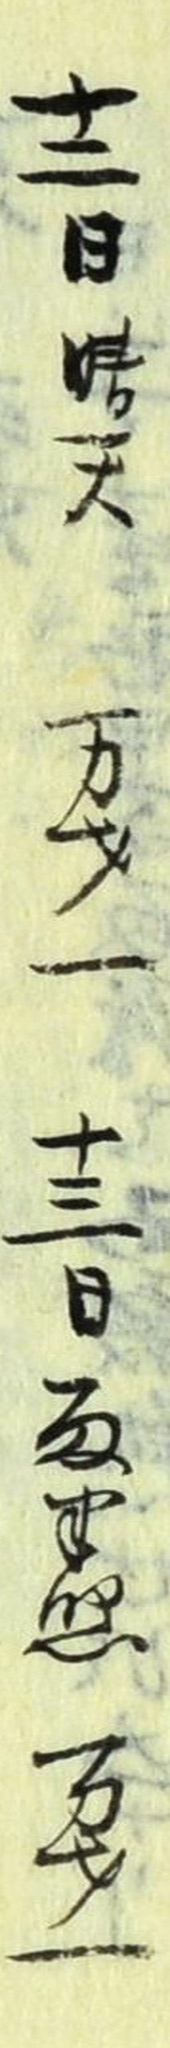十二日晴天万才一十三日雨半照万才一
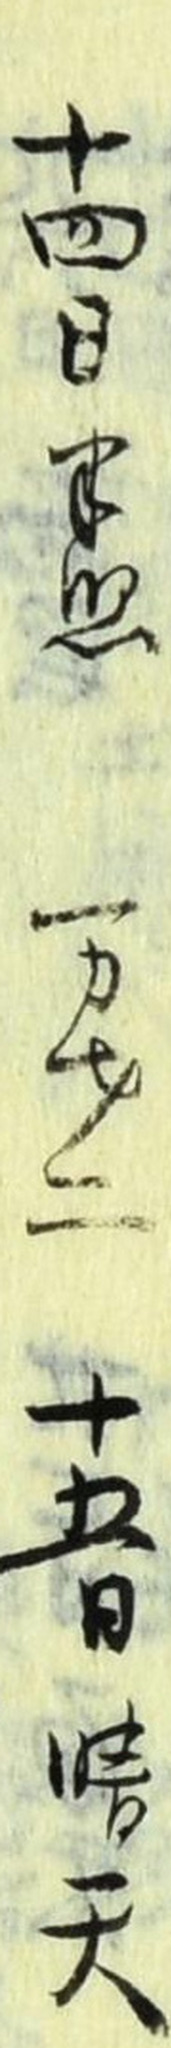十四日半照万才二十五日晴天
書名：（日記）
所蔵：福井県文書館 Fukui Prefectural Archives
